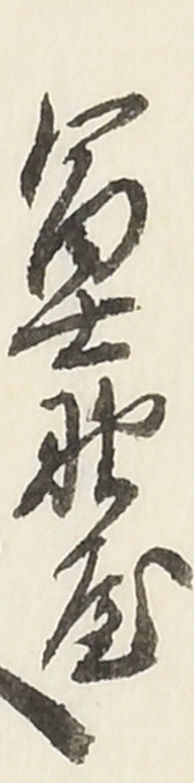富士野屋
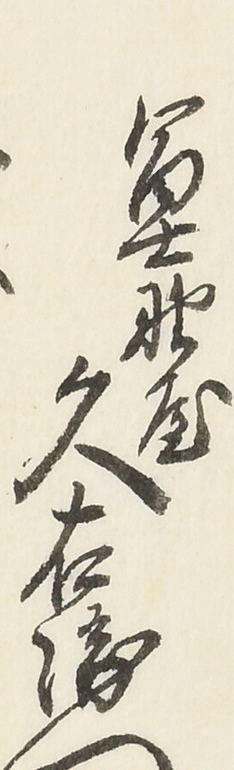富士野屋
